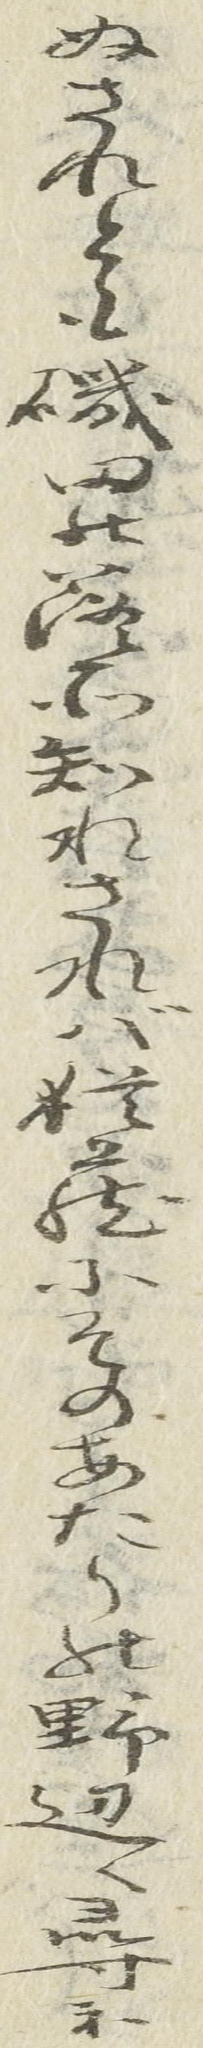ぬされとも磯田の落所知れされば猶蔵にそのあたりの野辺へ尋ね
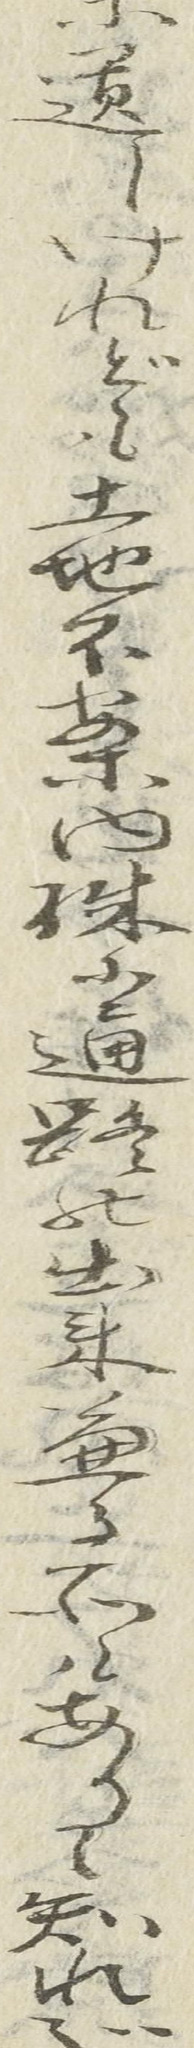に遣りけれども土地不案内誠に通路の出来兼る所もありて知れじ
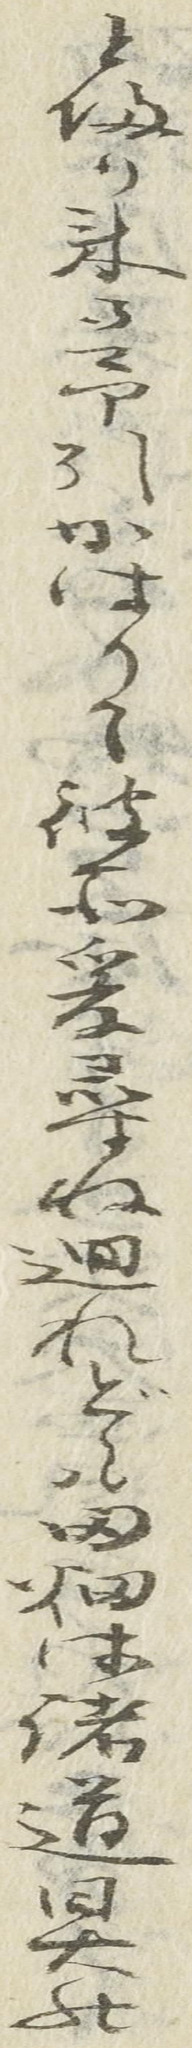と帰り来る予引かはりて彼所爰尋ね廻れども田畑は諸道具の
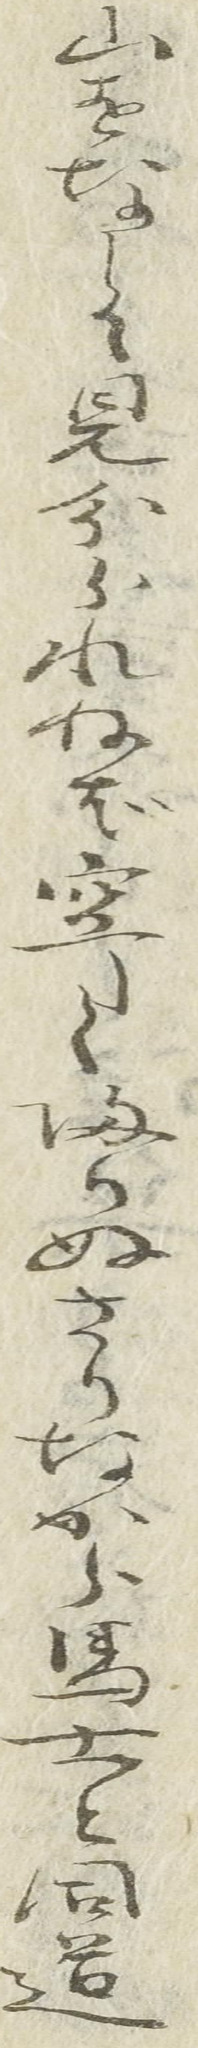山をなして見分られねば空しく帰りぬさりなから馬士と同道
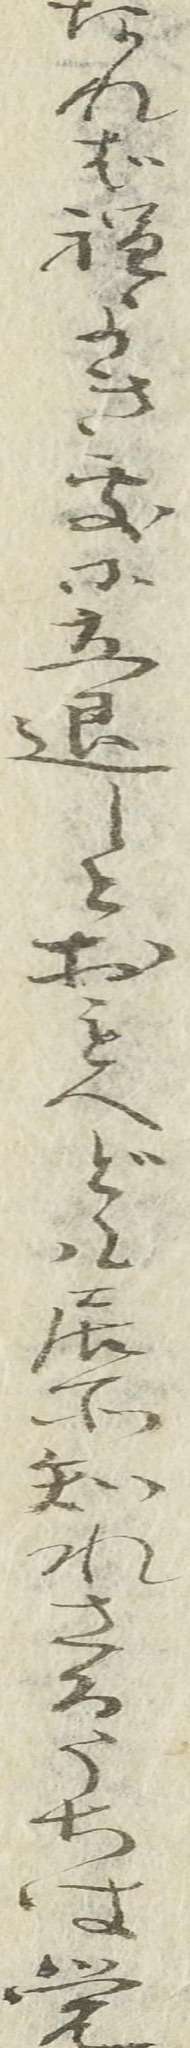なれば程よき處に立退しとおもへども居所知れさるうちは覚
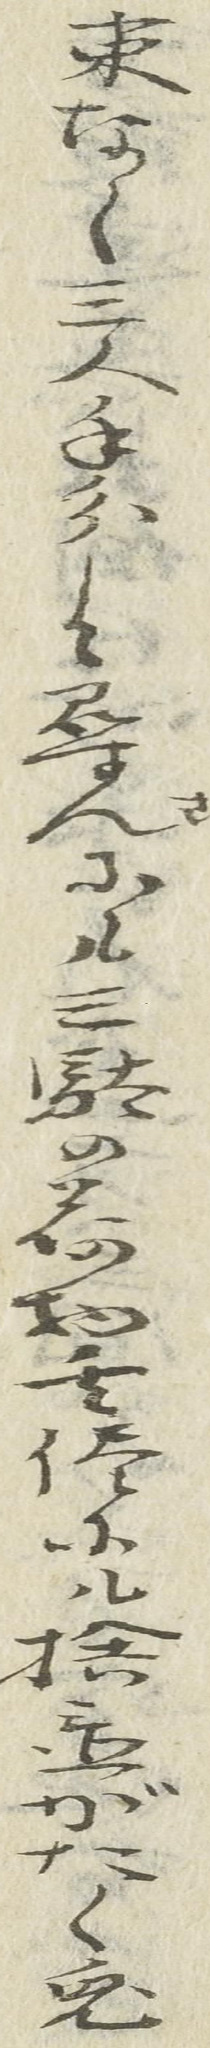束なし三人手分して尋んにも三駄の荷物其侭にも捨置がたく兎
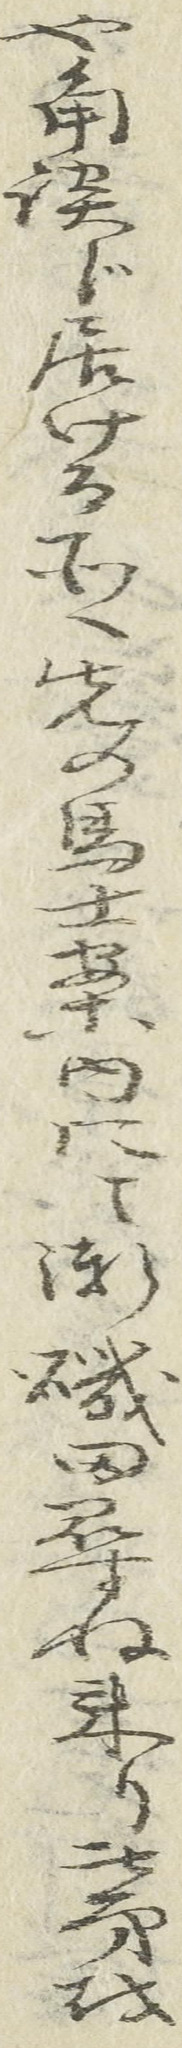や角談じ居ける所へ先の馬士案内にて漸磯田尋ね来り次第を
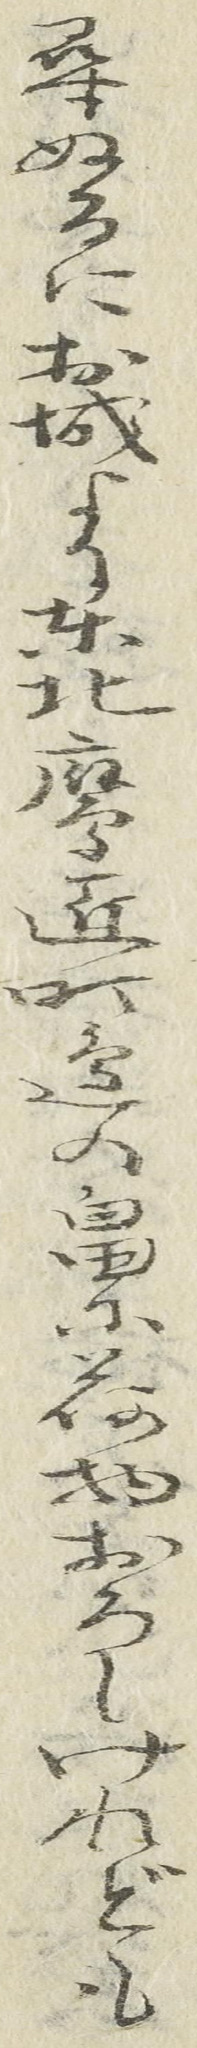尋ぬるにお城より東北鷹匠町辺の畠に荷物おろしけれども
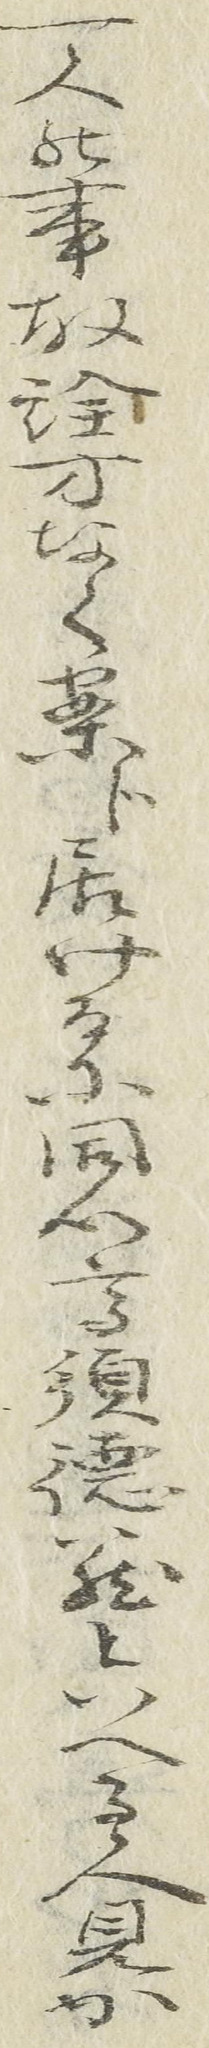一人の事故詮方なく案じ居けるに同心高須徳蔵といへる人見か
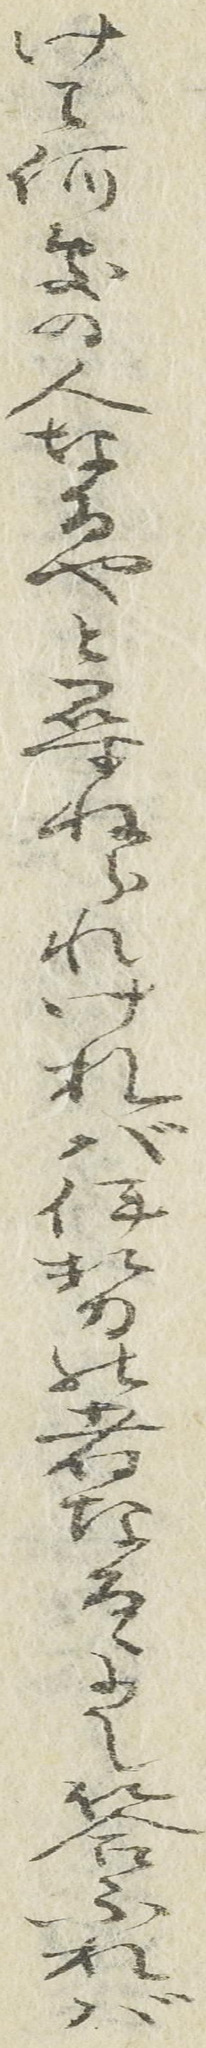けて何處の人なるやと尋ねられけれバ伊勢の者なるよし答ふれバ
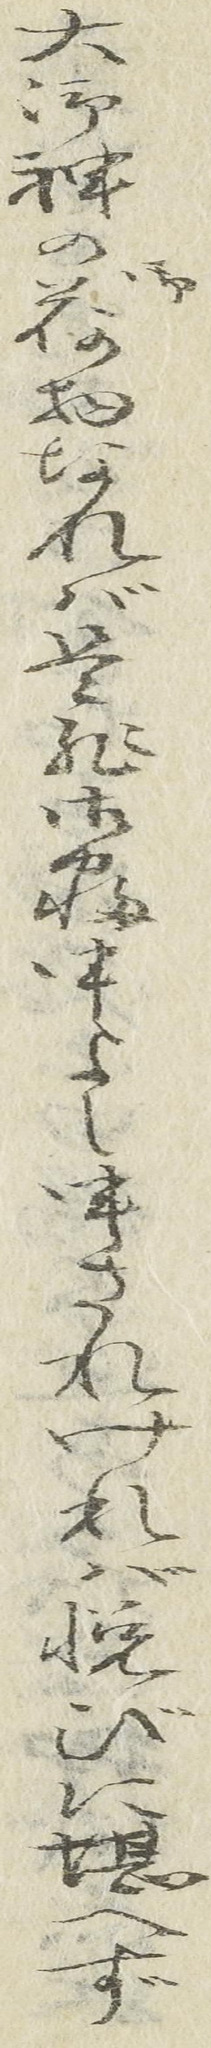大御神の御荷物なれバ是非御寝申よし申されけれバ悦びに堪へず
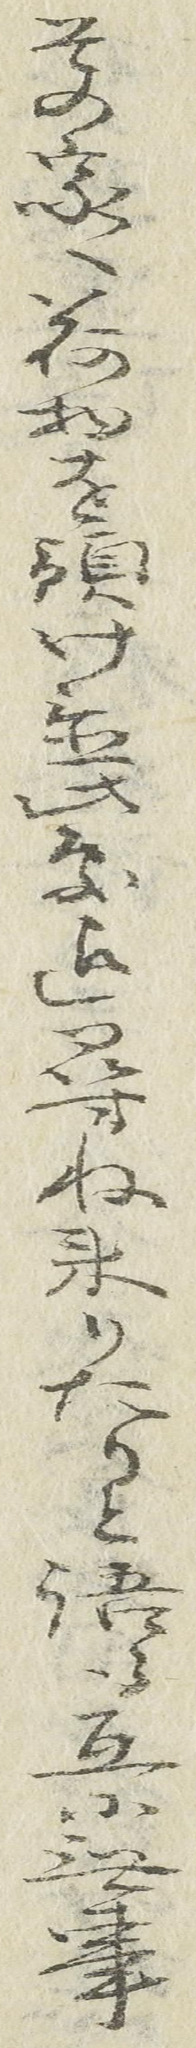その家へ荷物を預け置此處迄尋ね来りたりと語り互に無事
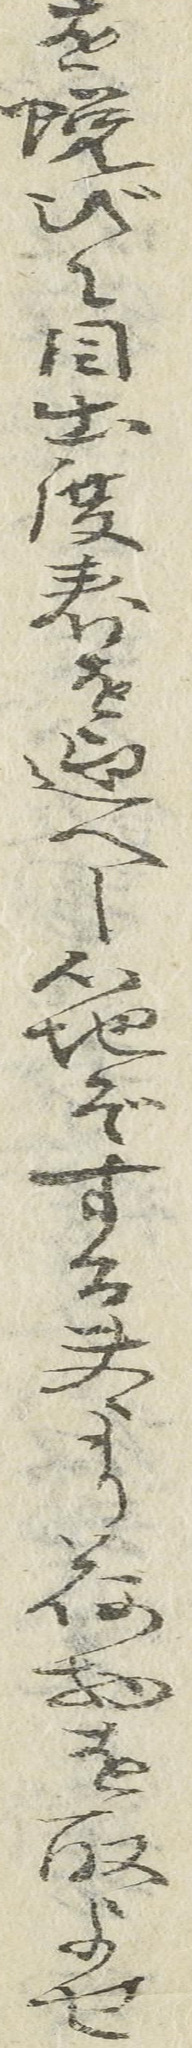を悦びて目出度春を迎へし心地ぞする夫より荷物を取よせ
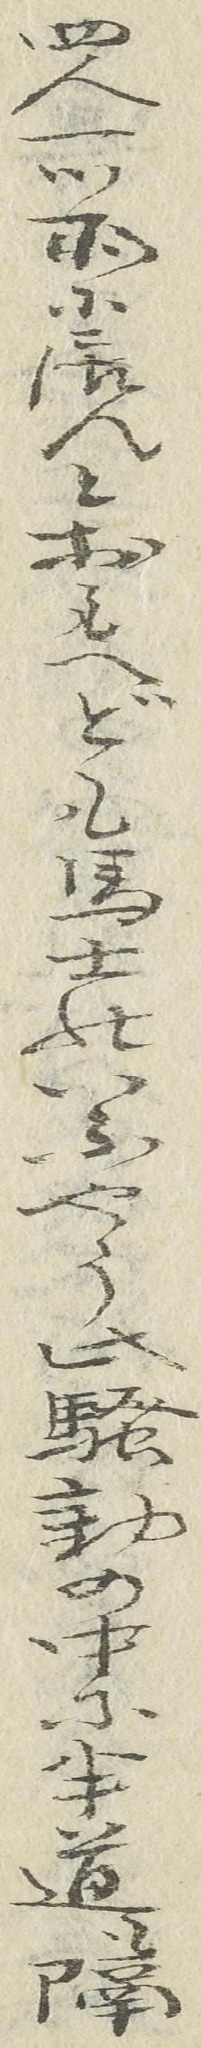四人一ツ所に居んとおもへども馬士のいふやう此騒動の中に半道も隔
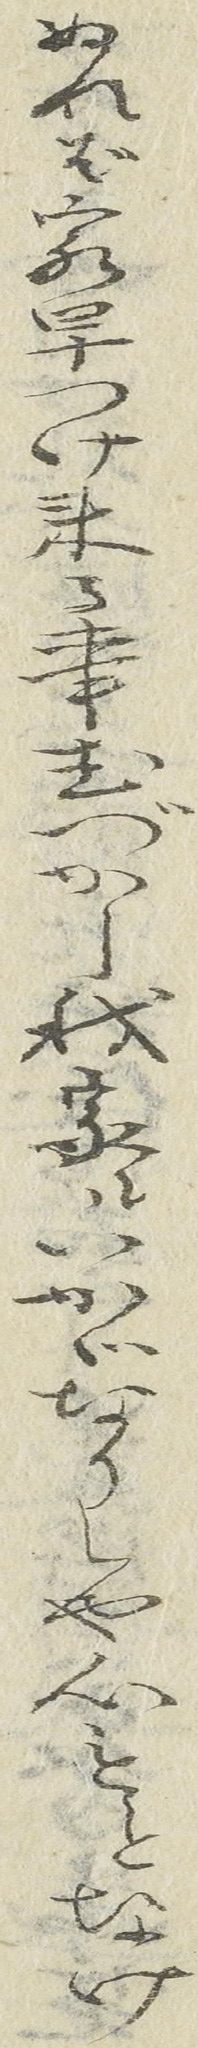ぬれば最早つけ来る事むづかし我家もいかゞなりしや心もとなけ
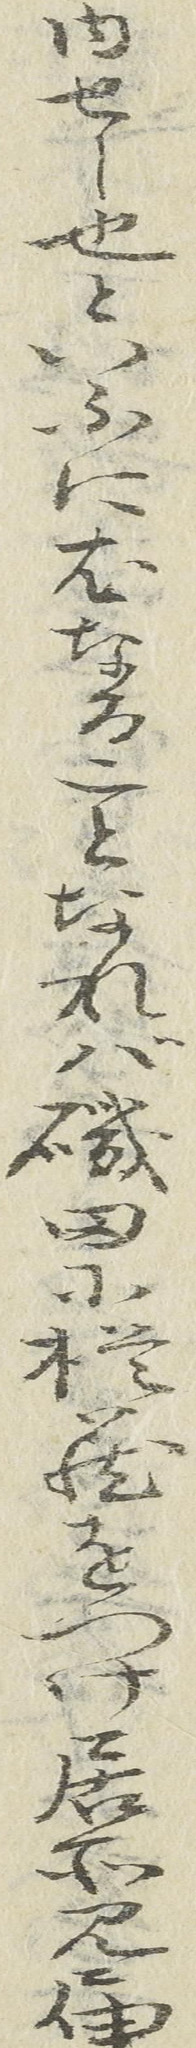内せし也といふに尤なることなれバ磯田に樽蔵をつけ居所見届
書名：地震前兆集　全
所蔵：東京大学地震研究所図書室 Earthquake Research Institute Library, The University of Tokyo, JAPAN
